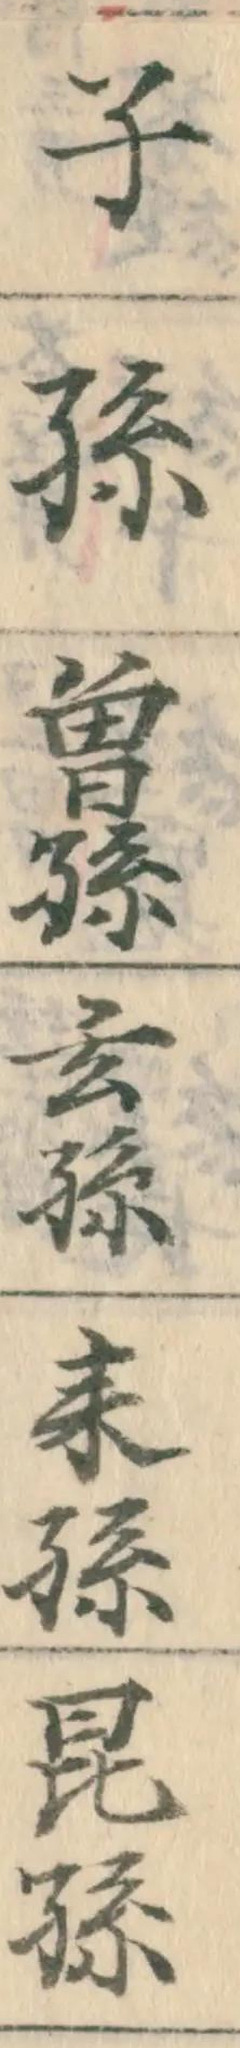子孫曽孫玄孫来孫昆孫
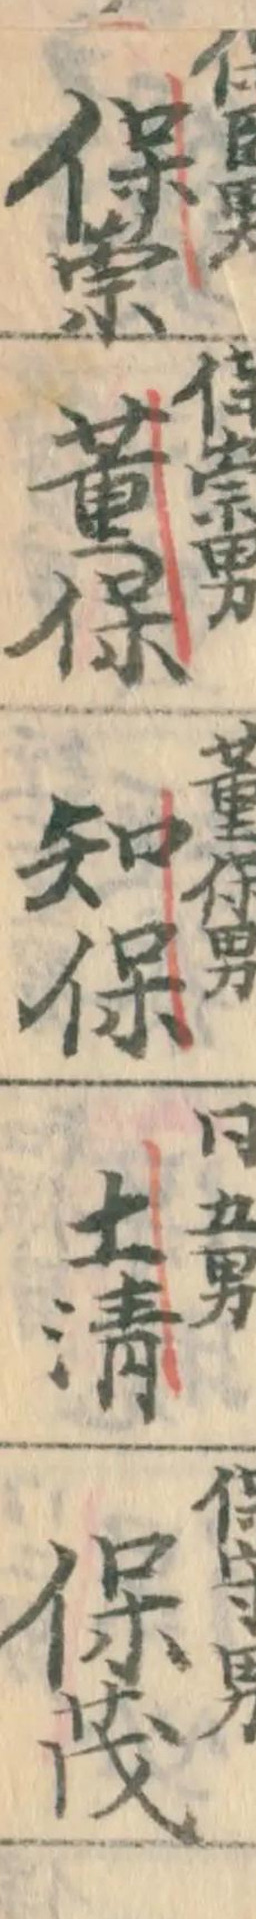保崇董保知保土清保茂

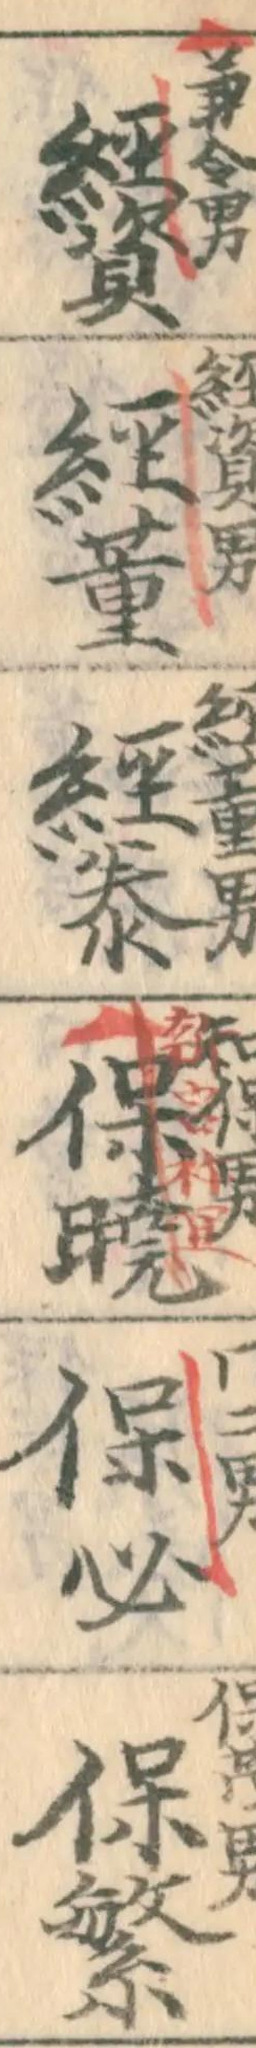経資経董経泰▲保暁保必保繁
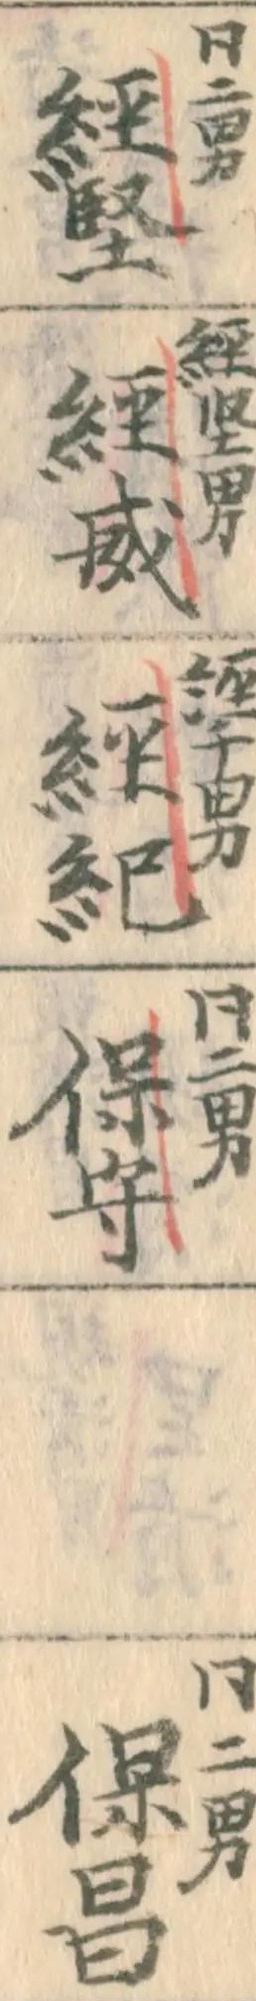経竪経威経紀保守保昌

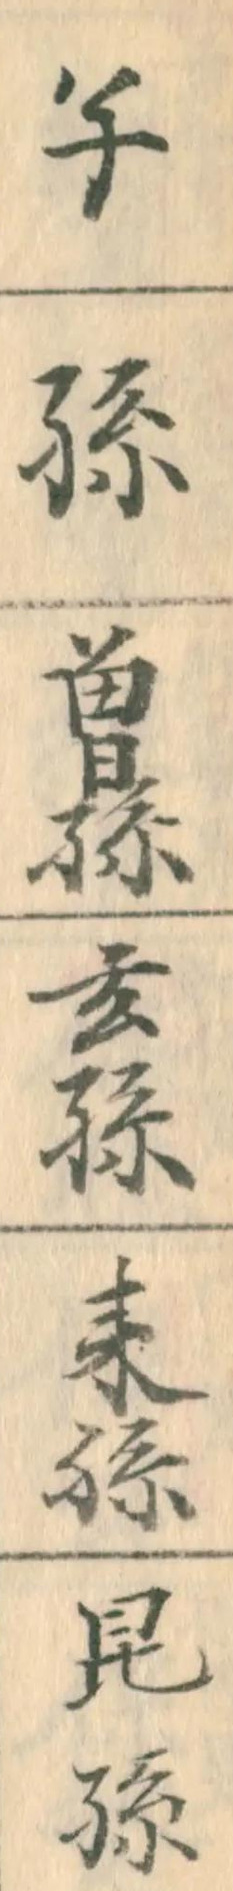子孫曽孫玄孫来孫昆孫
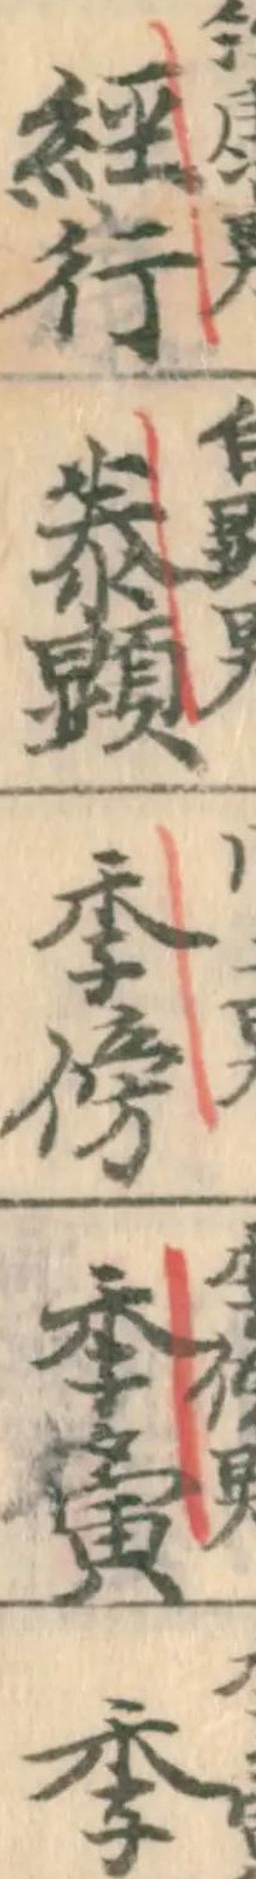経行泰顕季傍季寅季理
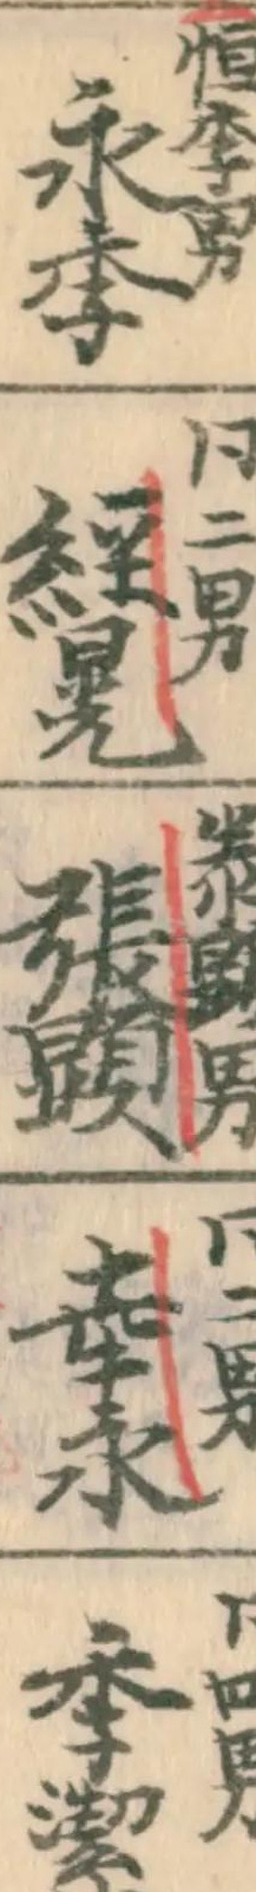永季経晃張顕幸永季潔
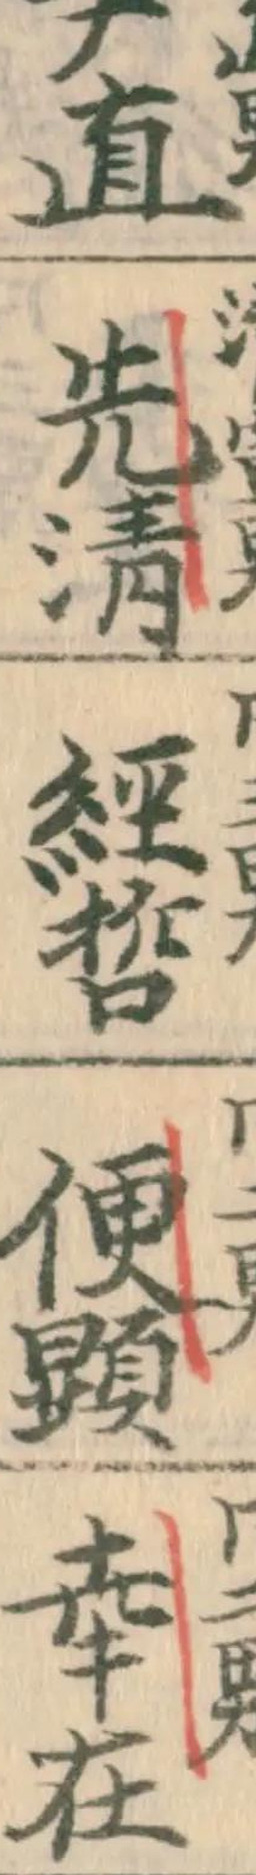尹直先清経哲便顕幸在
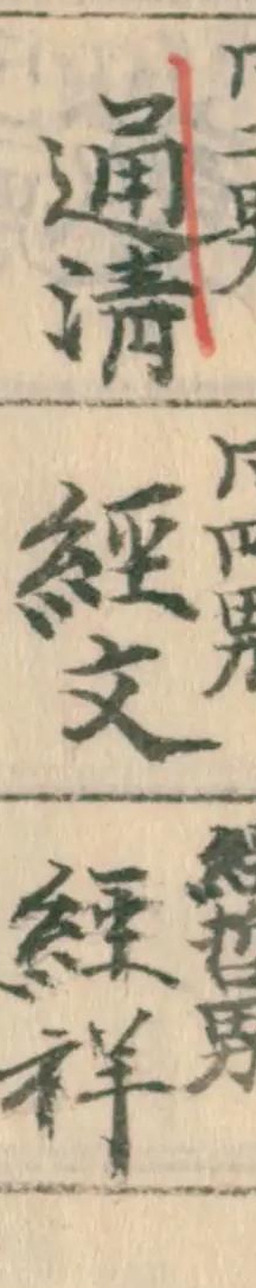通清経文経祥
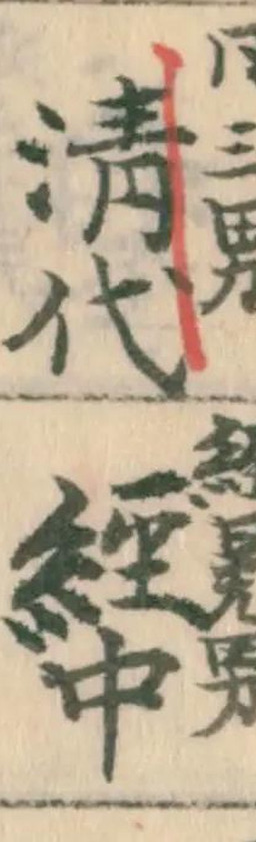清代経中

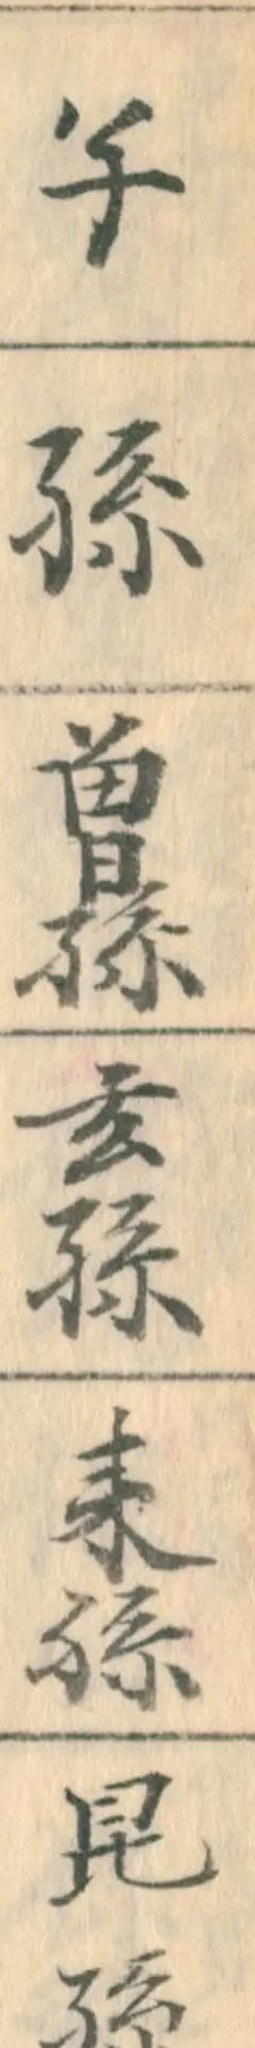子孫曽孫玄孫来孫昆孫
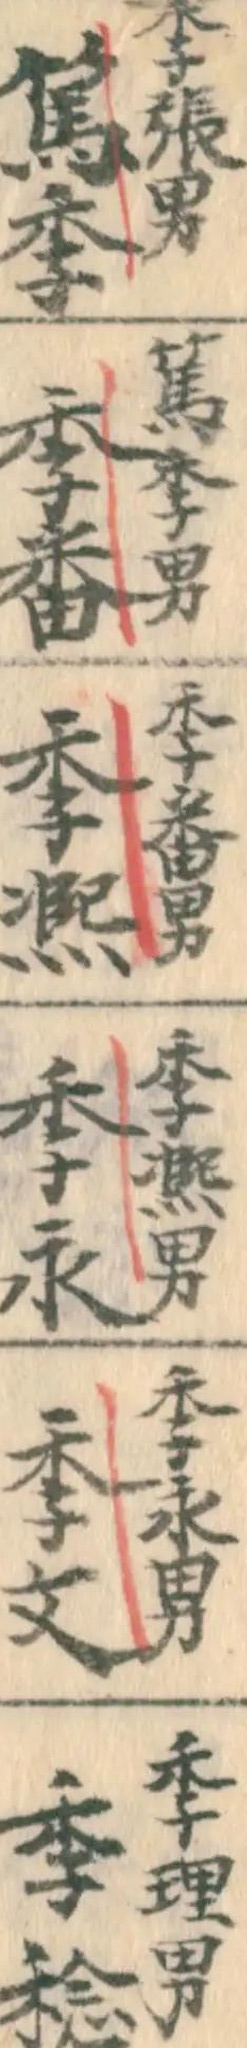篤季季番季凞季永季文季稔
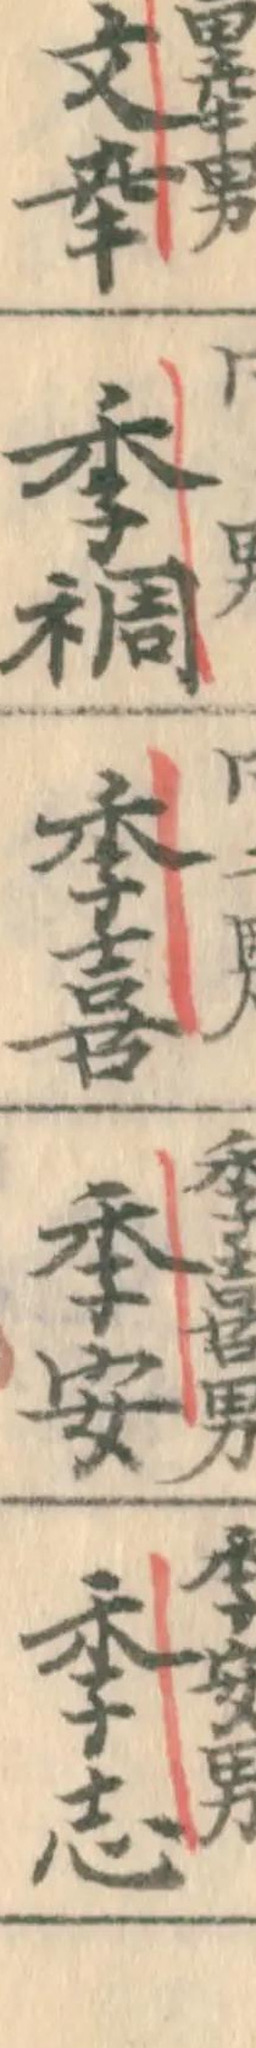文幸季裯季喜季安季志
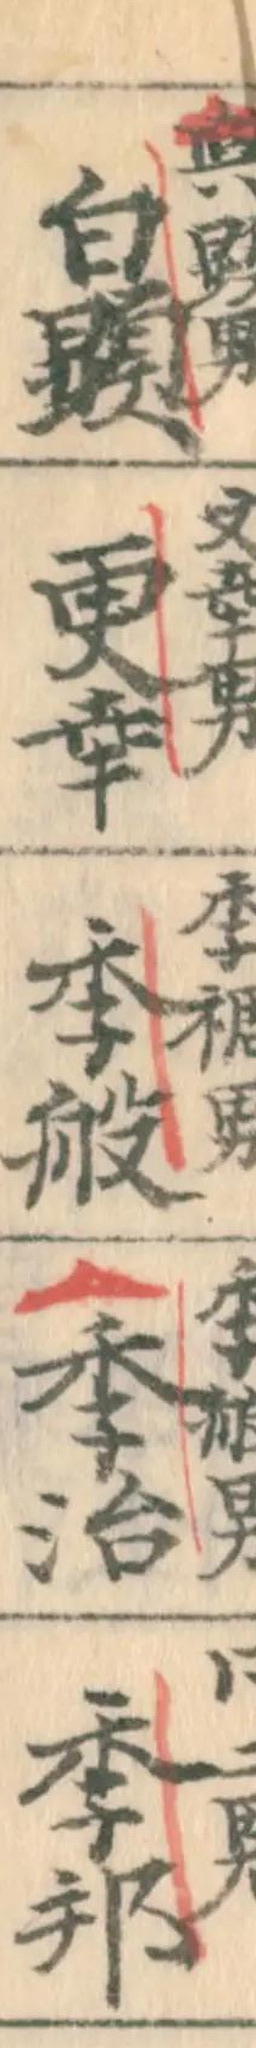白顕更幸季般▲季治季邦
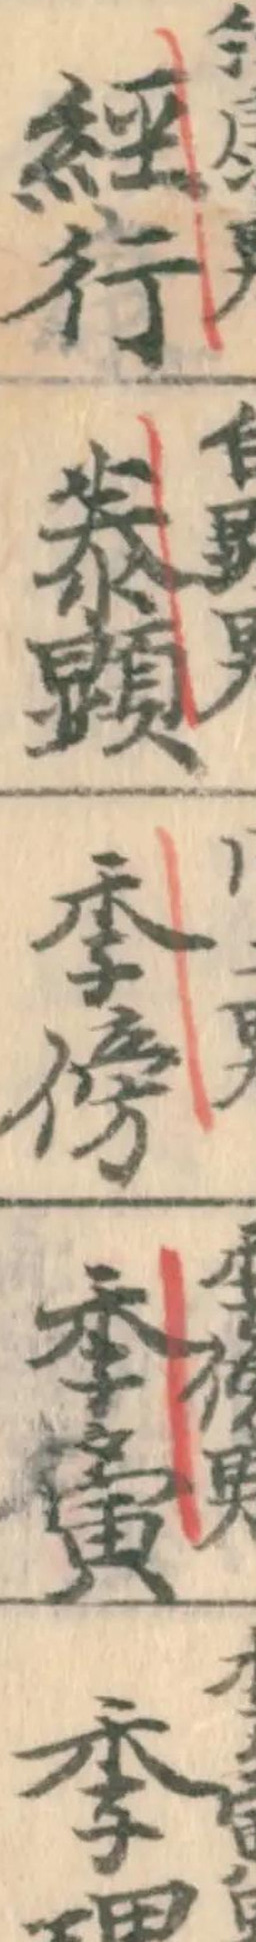経行泰顕季傍季寅季理
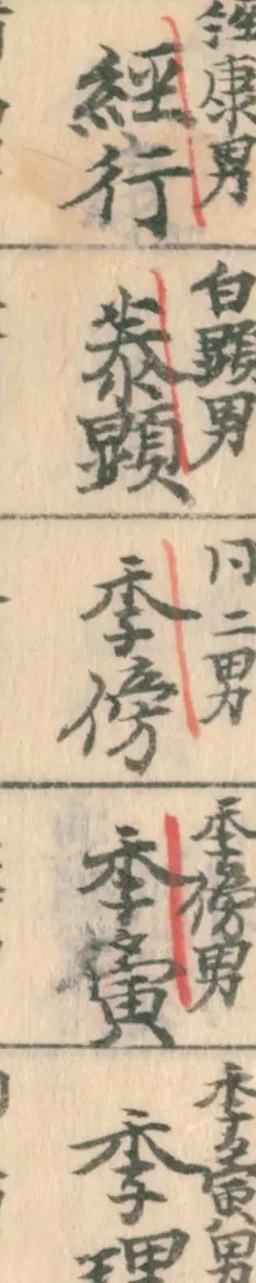経行泰顕季傍季寅季理
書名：賀茂社記録. 第24冊
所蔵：国立国会図書館 National Diet Library, JAPAN
